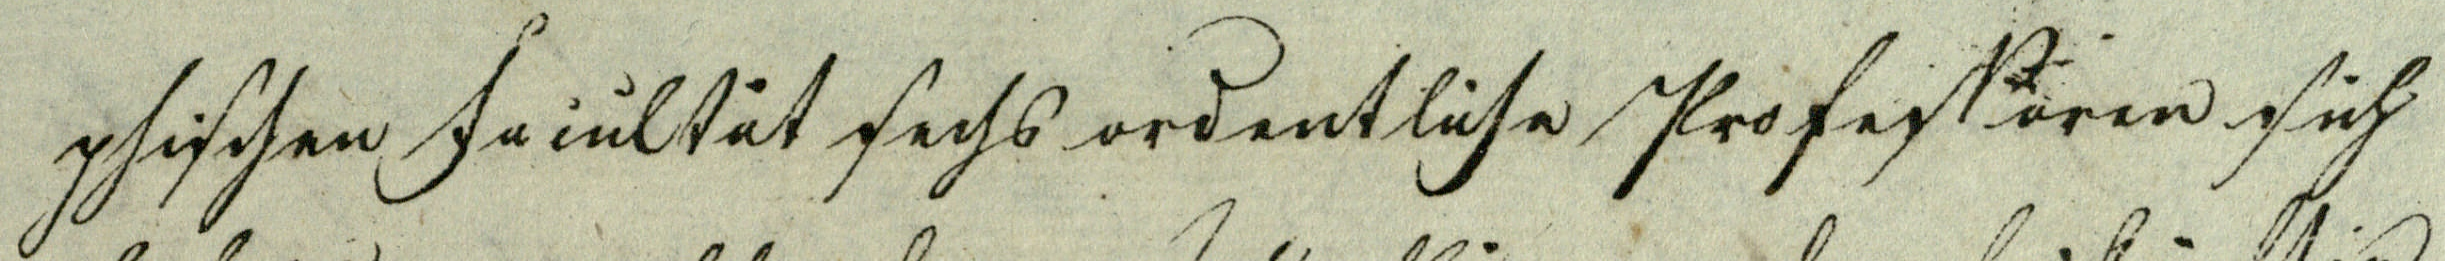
phischen Facultät sechs ordentliche Professoren sich
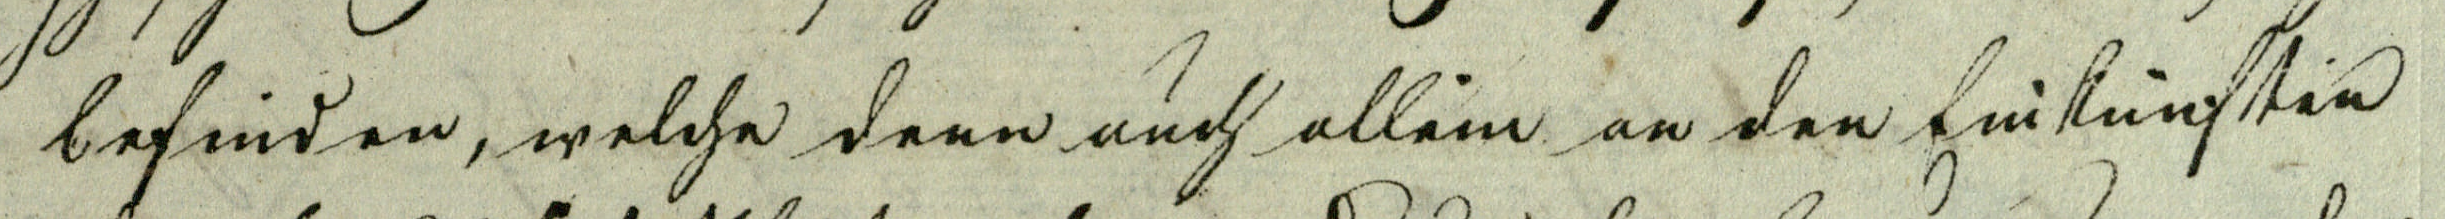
befinden, welche denn auch allein an den Einkünften
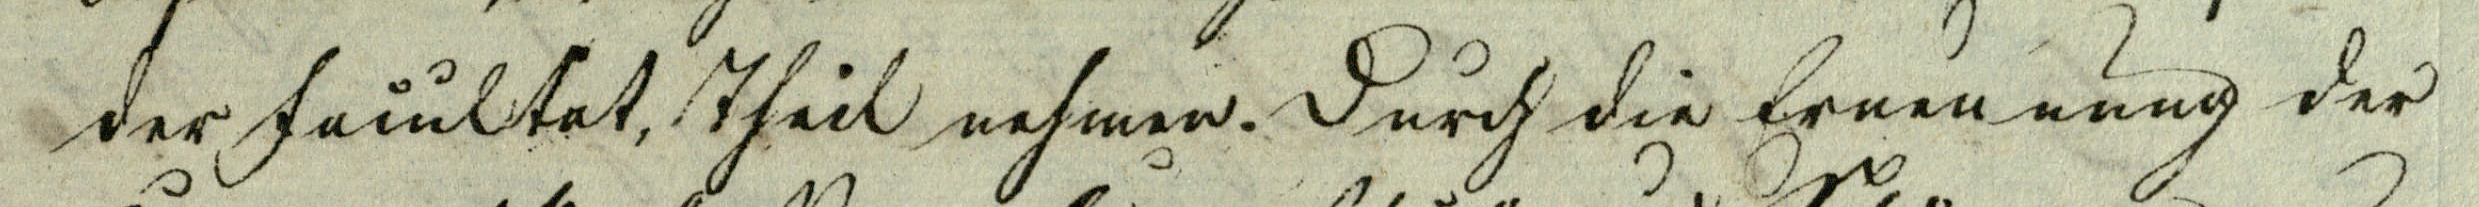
der Facultät, Theil nehmen. Durch die Ernennung der
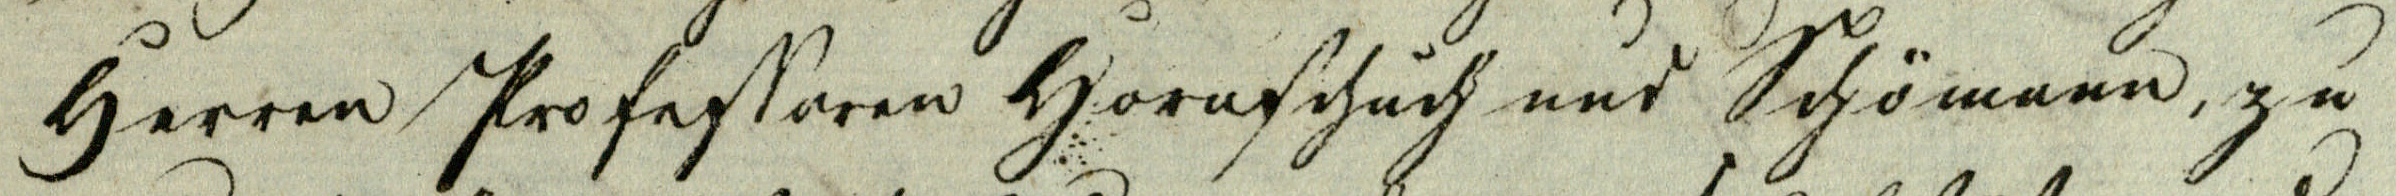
Herren Professoren Hornschuch und Schömann, zu
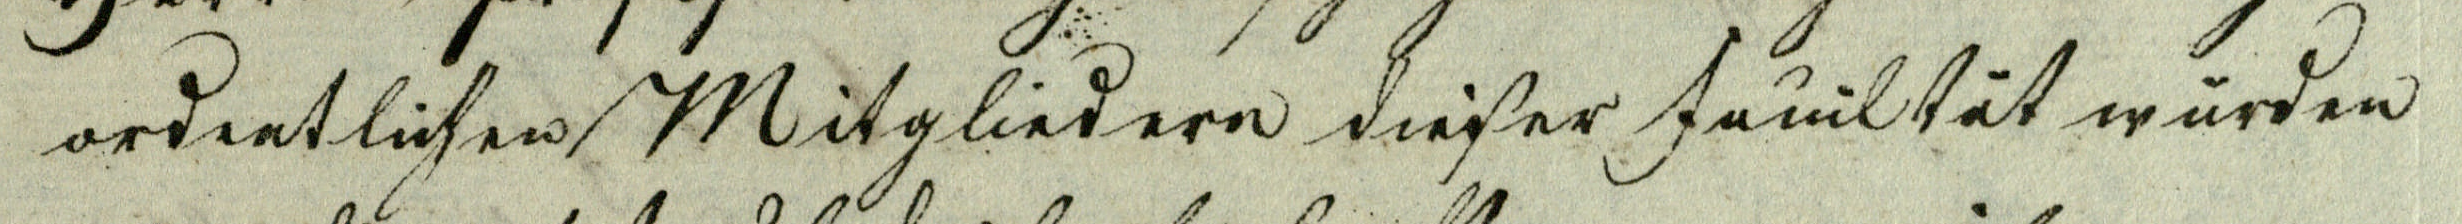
ordentlichen Mitgliedern dieser Facultät würden
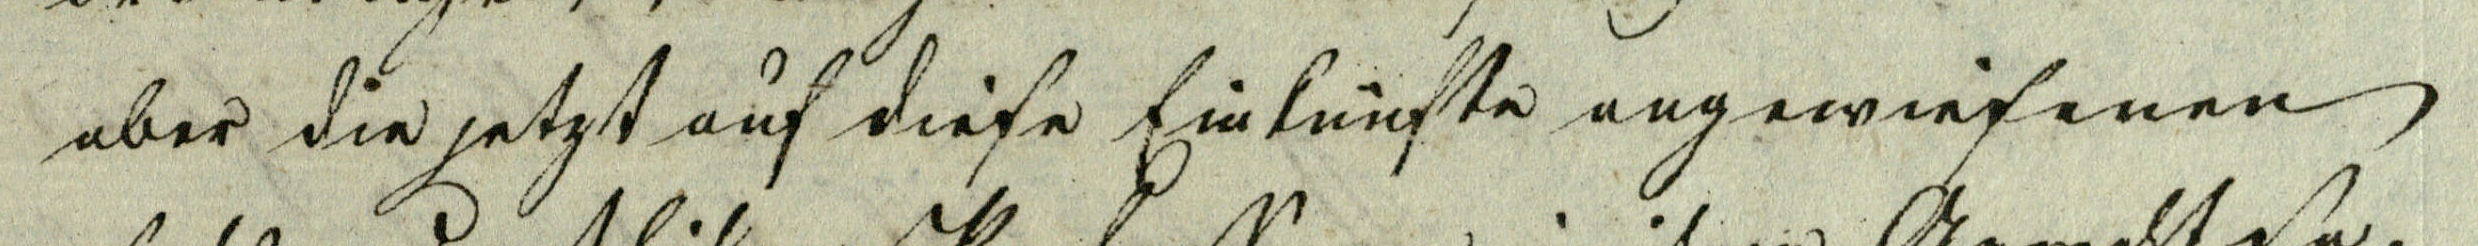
aber die jetzt auf diese Einkünfte angewiesenen
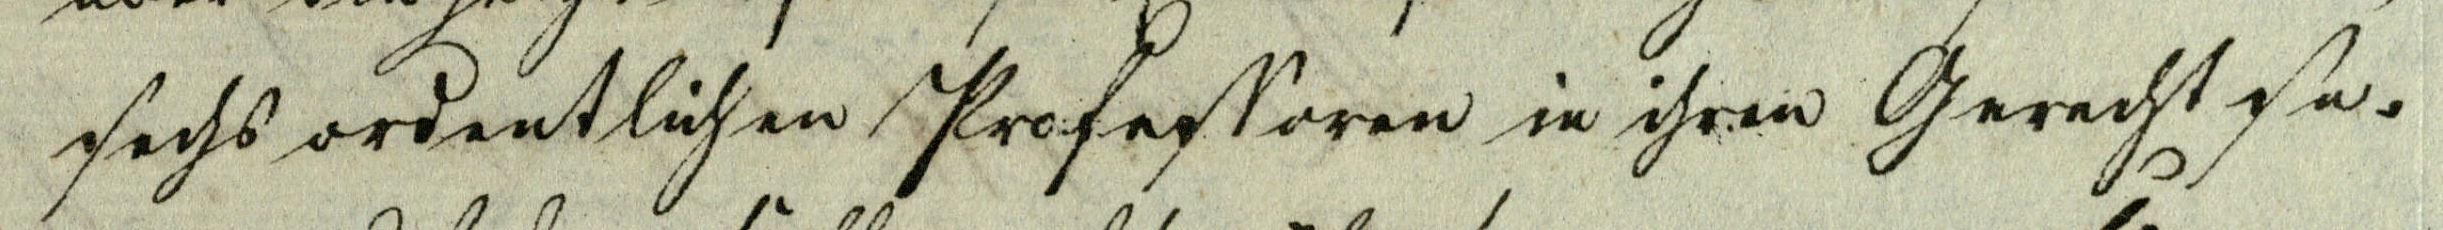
sechs ordentlichen Professoren in ihren Gerechtsa¬
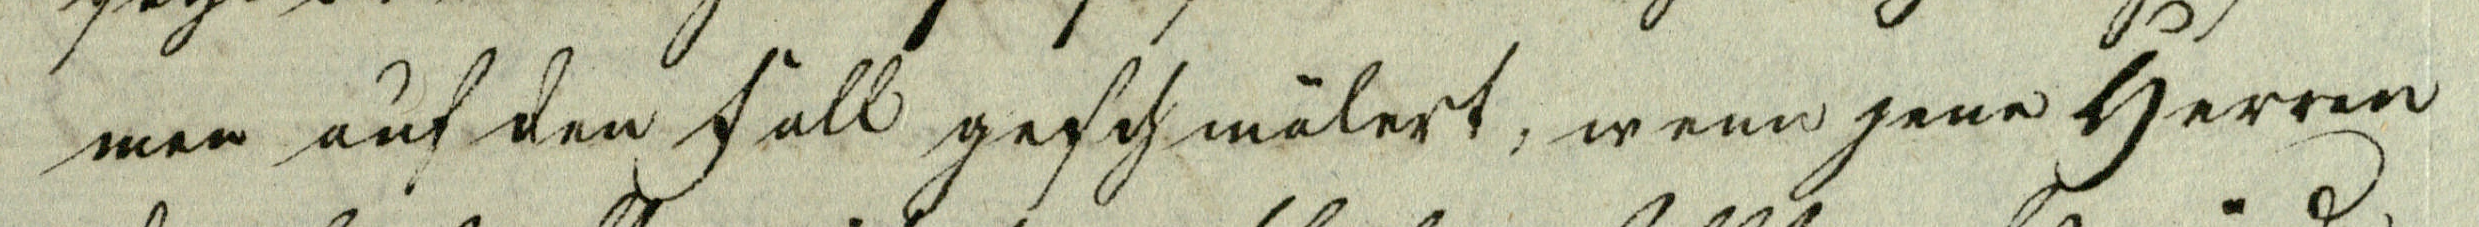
men auf den Fall geschmälert, wenn jene Herren
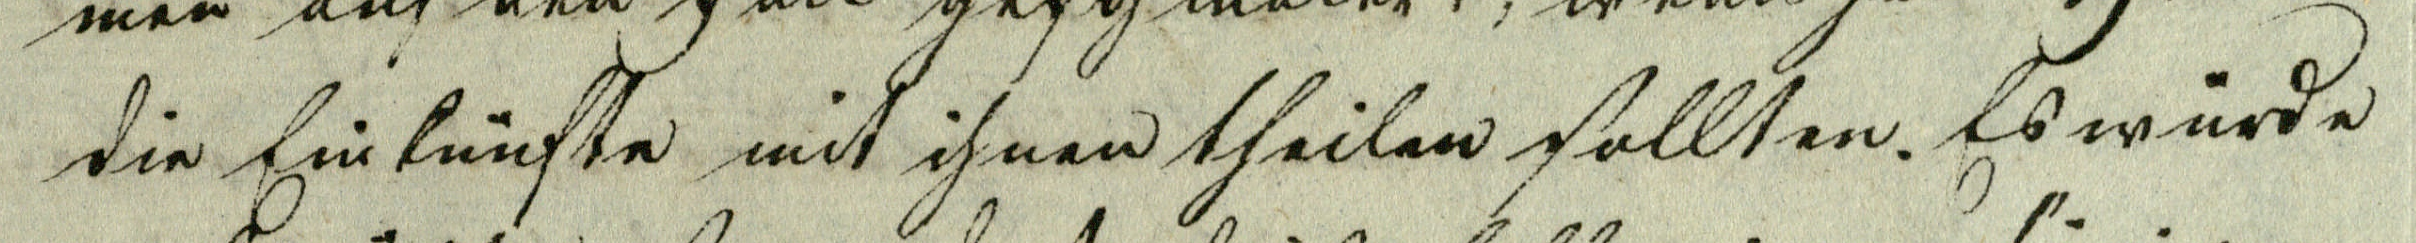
die Einkünfte mit ihnen theilen sollten. Es würde
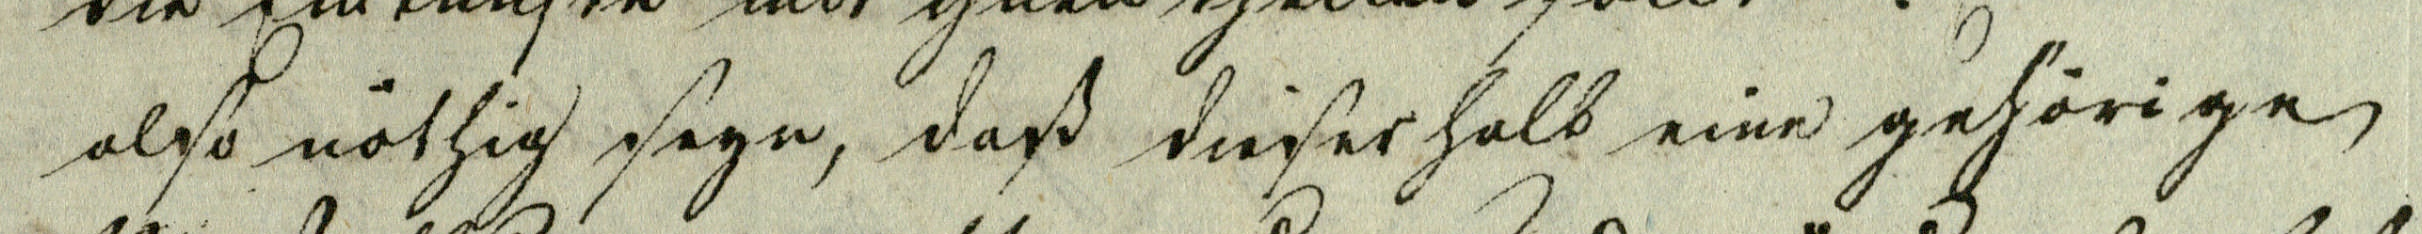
also nöthig seyn, daß dieserhalb eine gehörige,
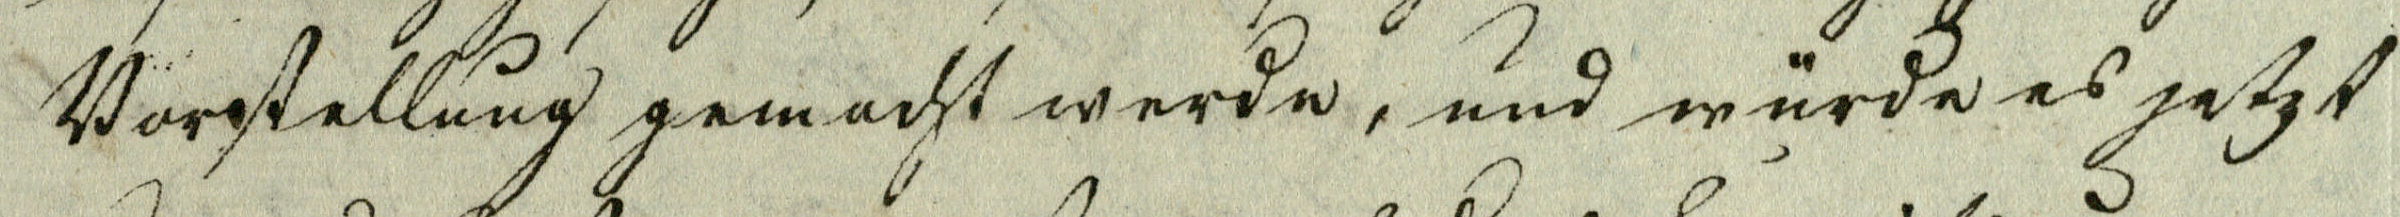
Vorstellung gemacht werde, und würde es jetzt
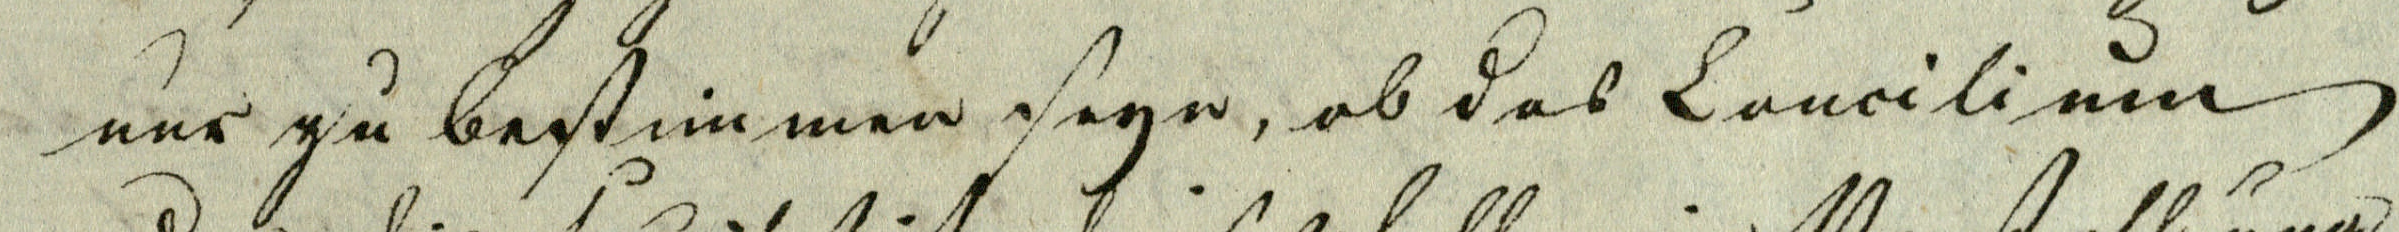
nur zu bestimmen seyn, ob das Concilium
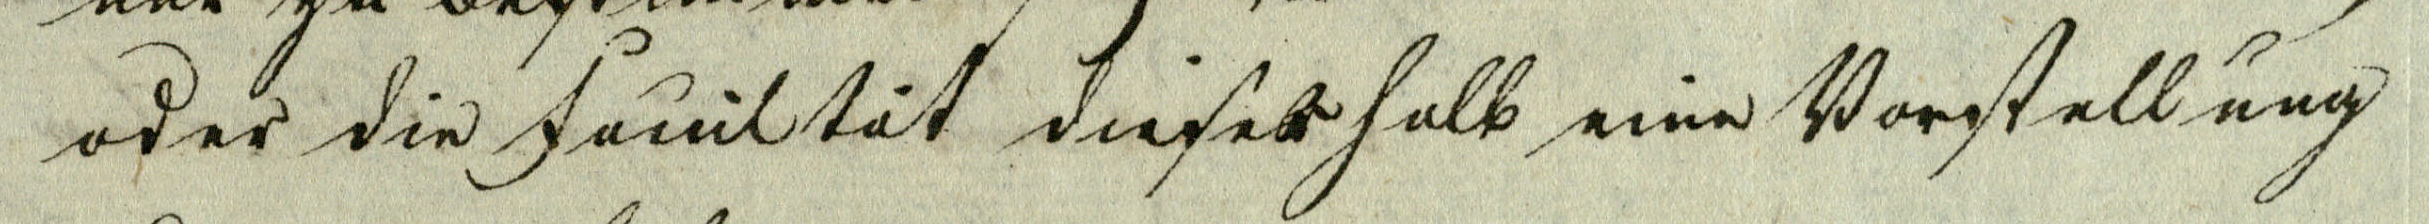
oder die Facultät dieserhalb eine Vorstellung
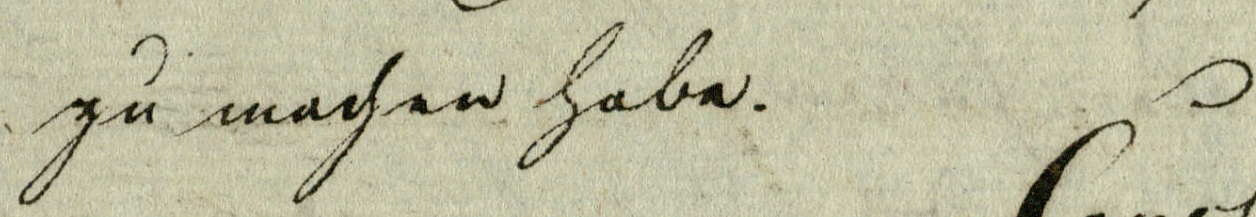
zu machen habe.
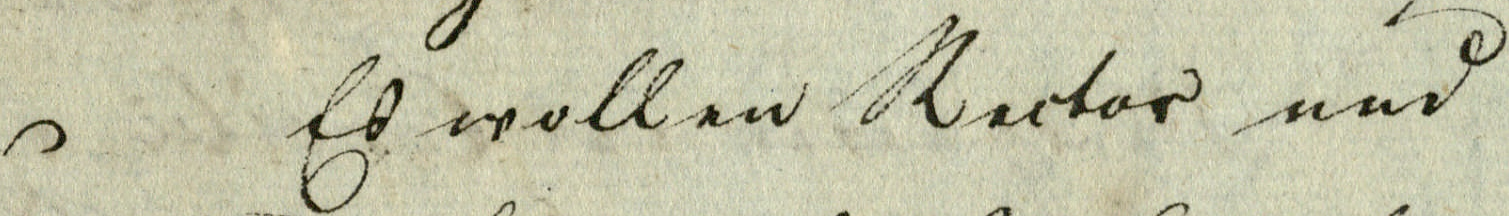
Es wollen Rector und
